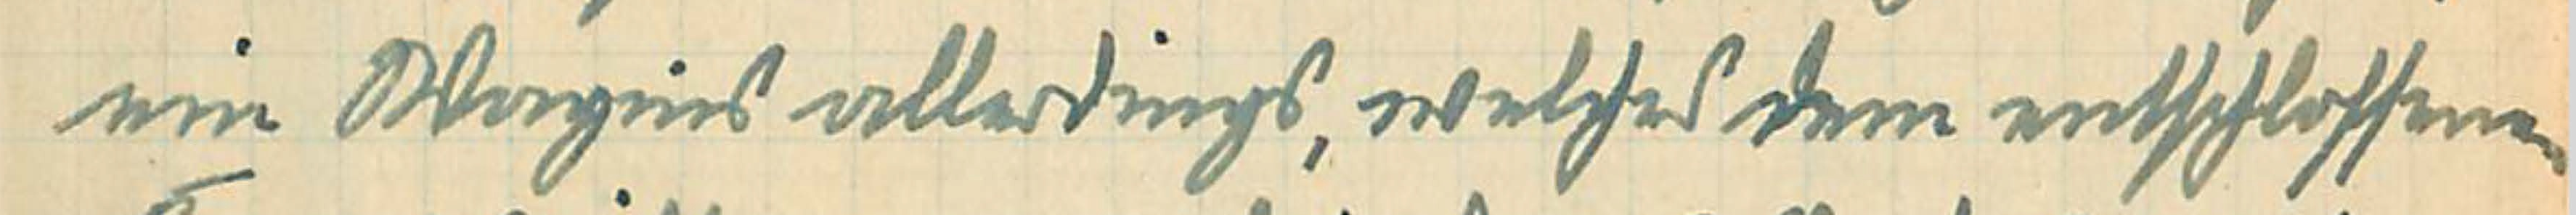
ein Wagnis allerdings, welches dem entschlossenen
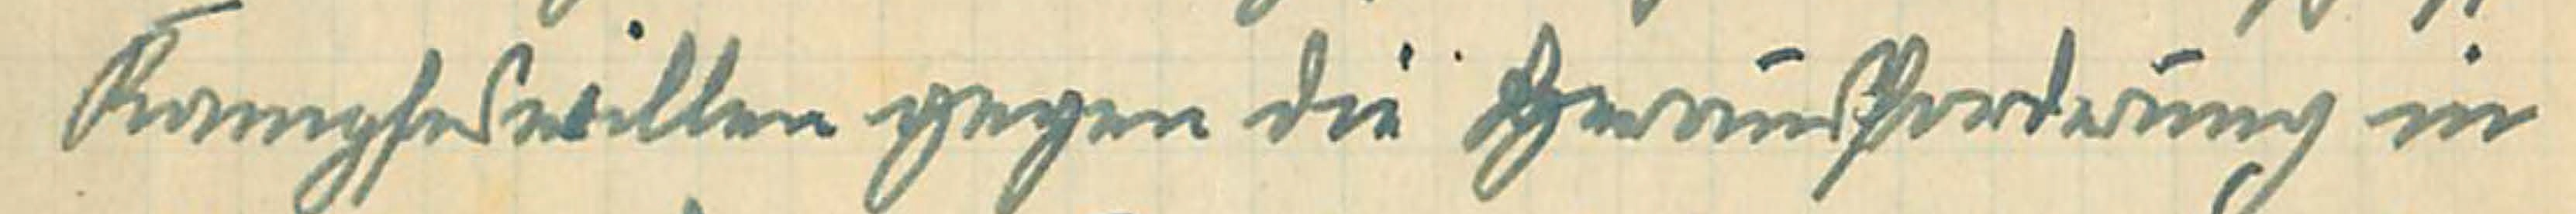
Kampfeswillen gegen die Herausforderung in
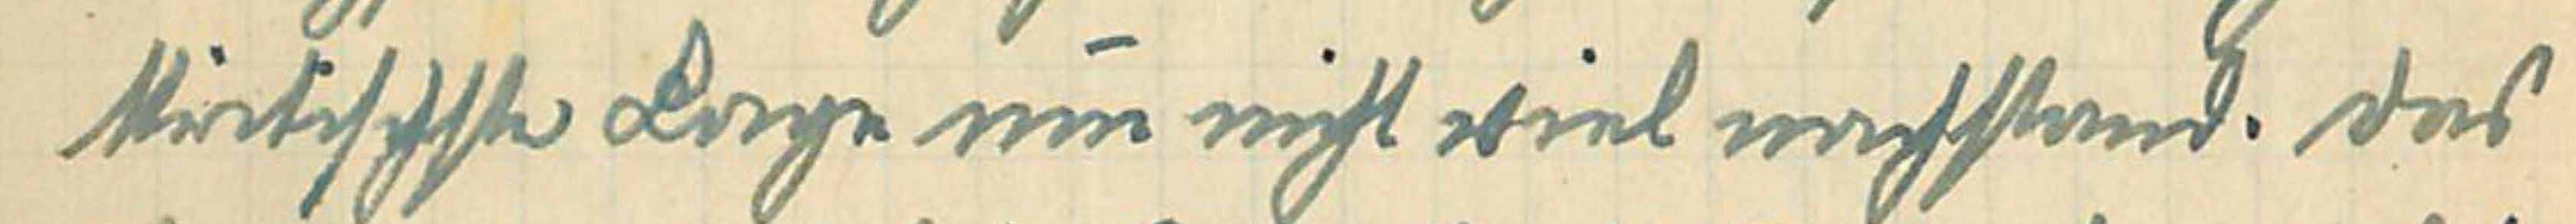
kritischer Lage nun nicht viel nachstand. Das
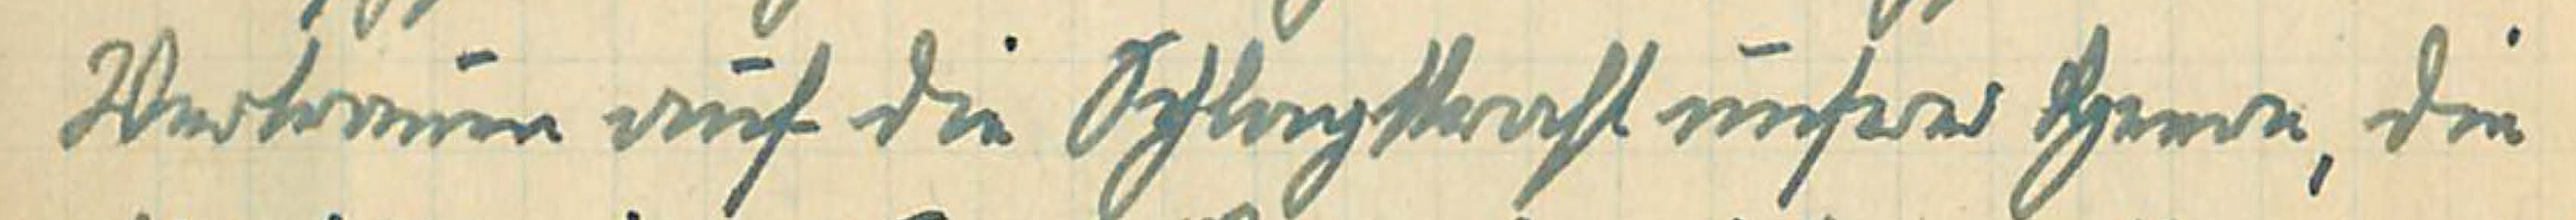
Vertrauen auf die Schlagkraft unserer Heere, die
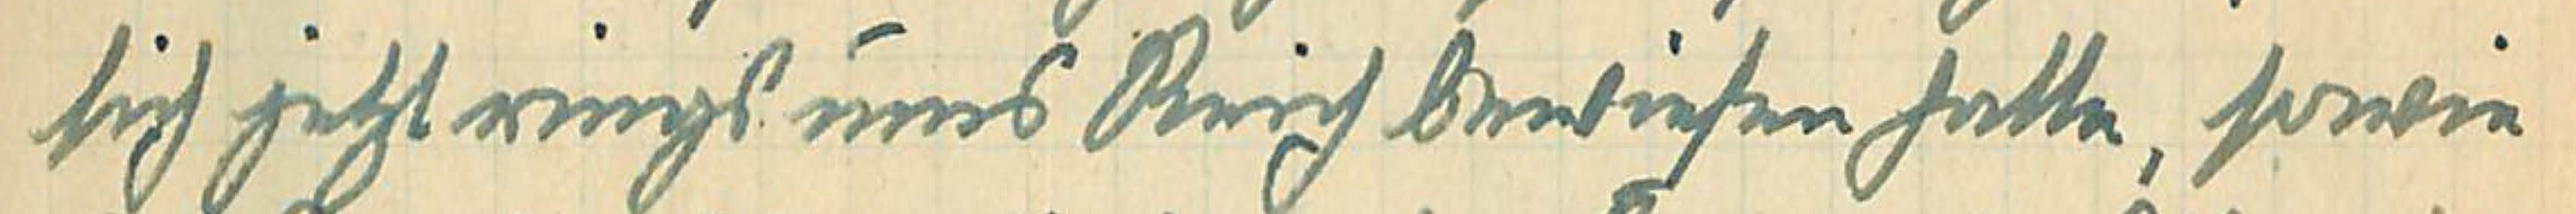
sich jetzt rings ums Reich bewiesen hatte, sowie
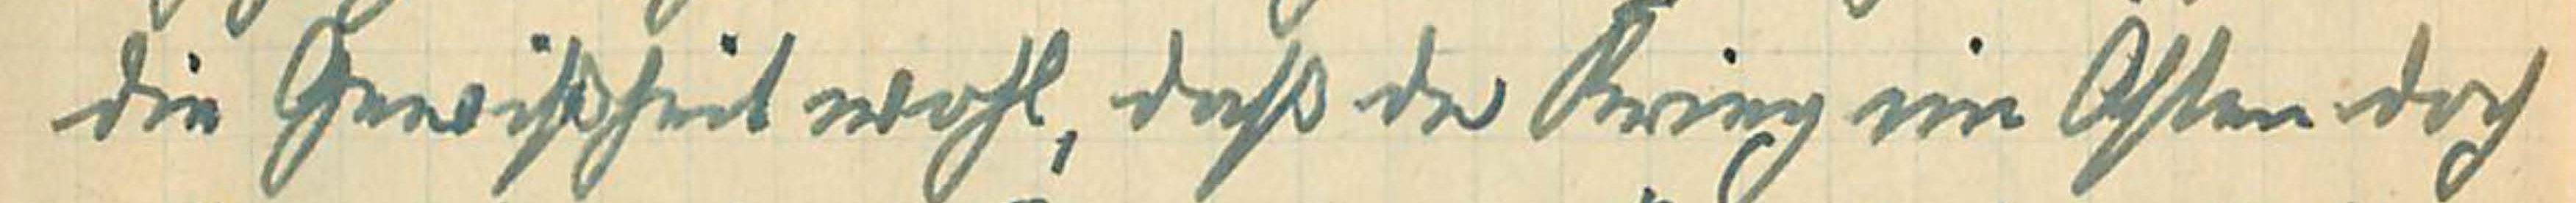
die Gewißheit wohl, daß der Krieg im Osten doch
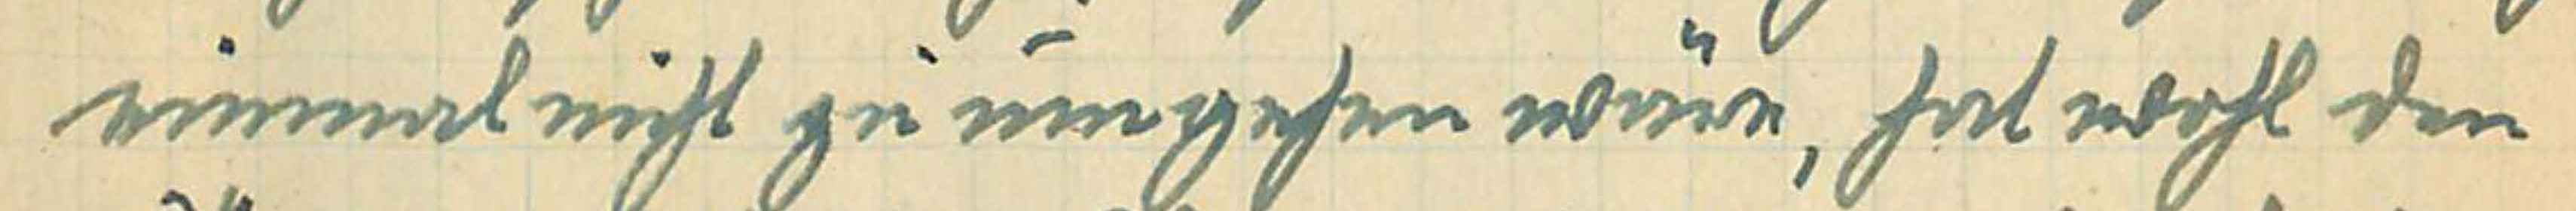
einmal nicht zu umgehen wäre, hat wohl den
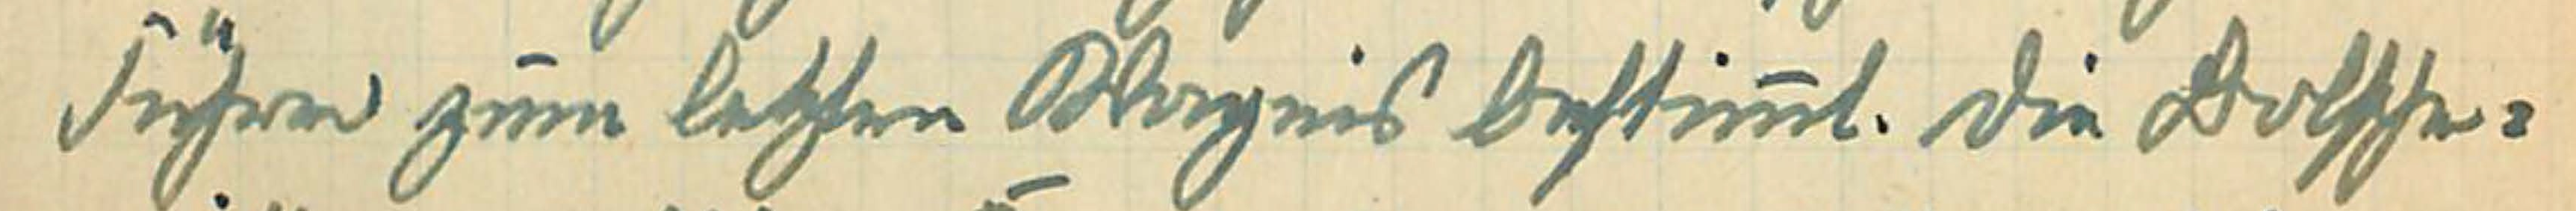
Führer zum letzten Wagnis bestimmt. Die Bolsche-
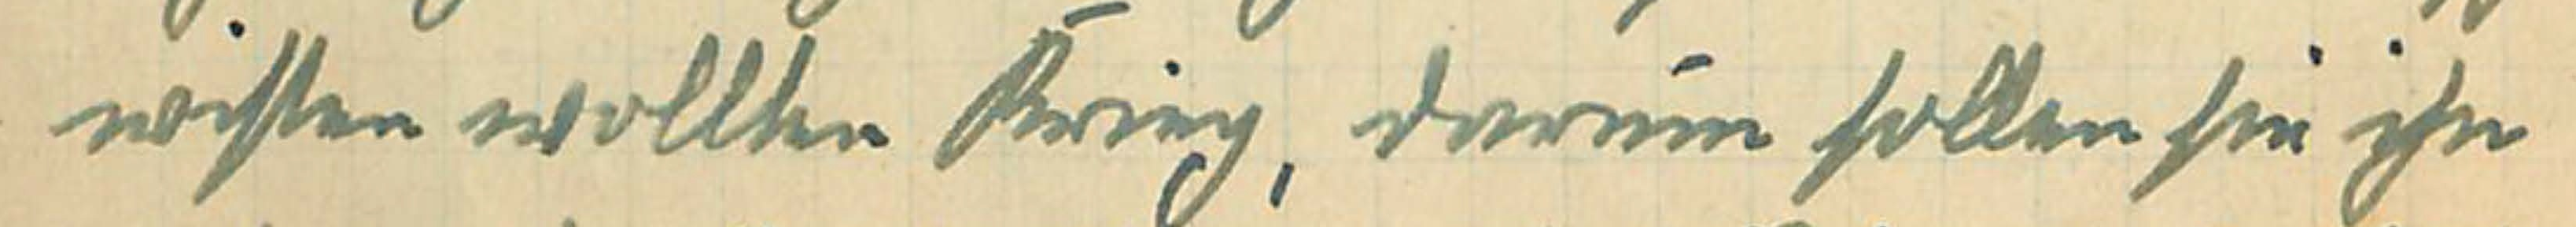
wisten wollten Krieg, darum sollen sie ihn
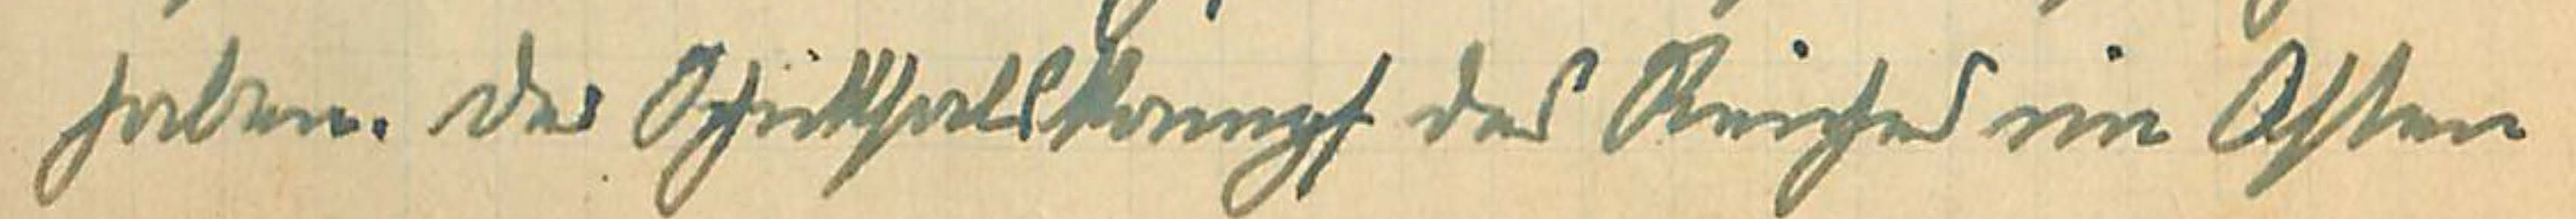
haben. Der Schicksalskampf des Reiches im Osten
